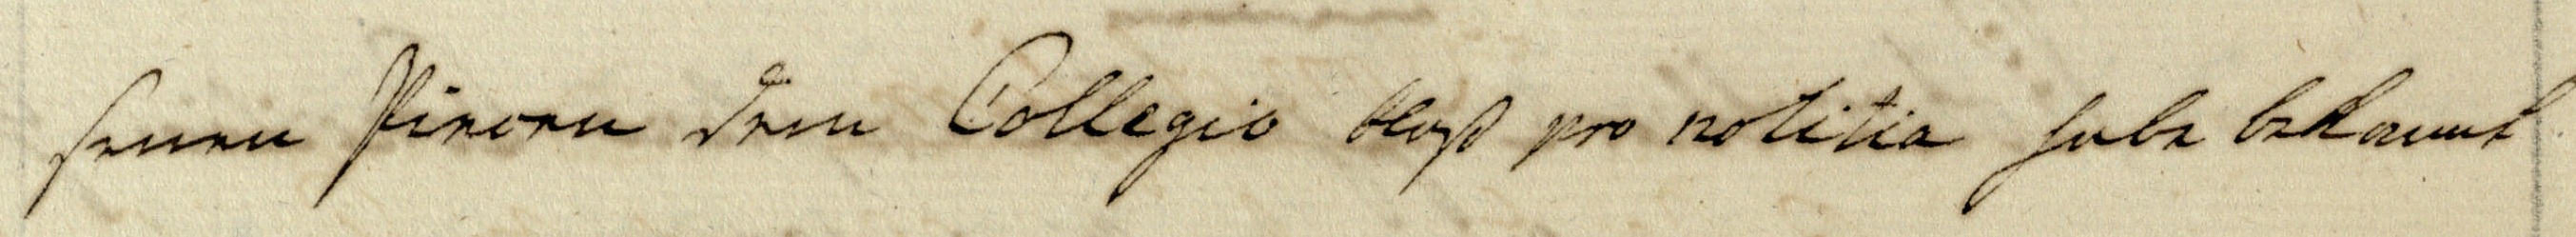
seinen Piecen dem Collegio bloß pro notitia habe bekannt
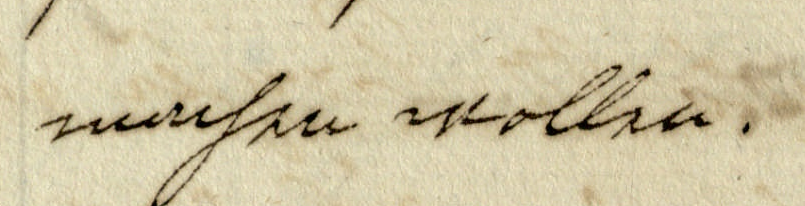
machen wollen.
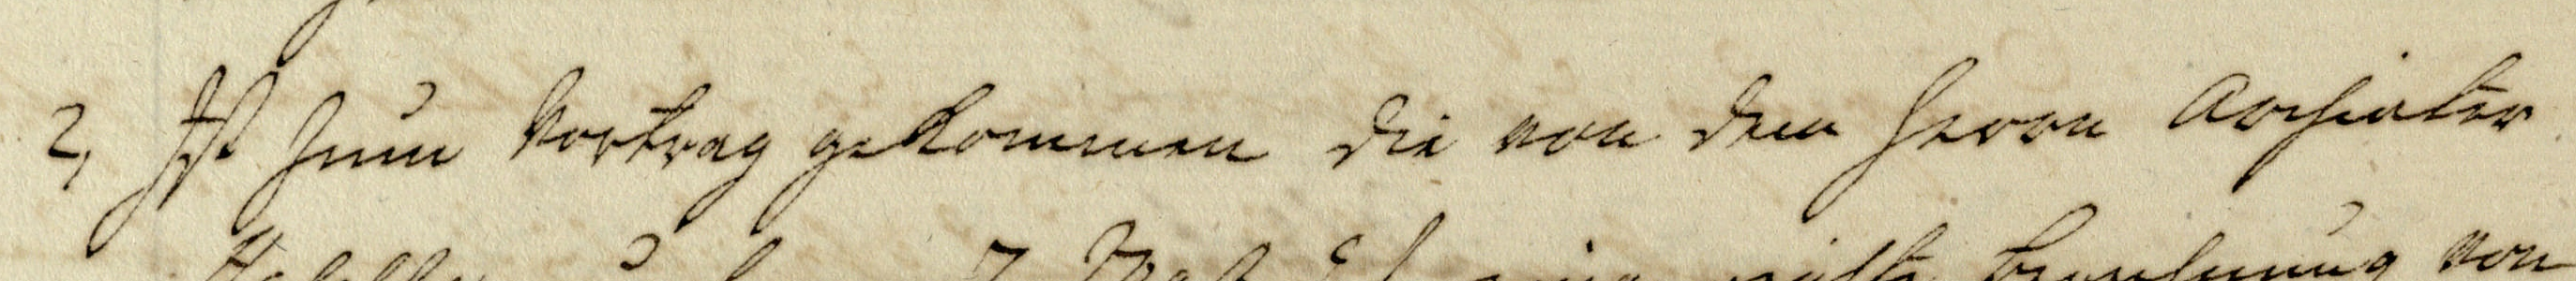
2, Ist zum Vortrag gekommen die von dem Herrn Archiater
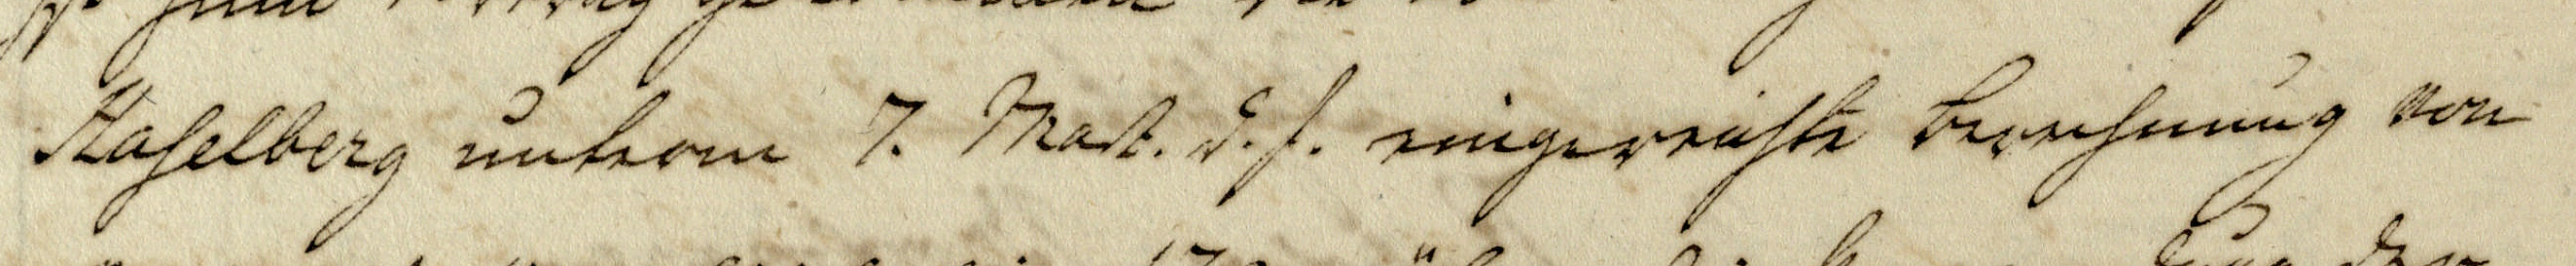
Haselberg unterm 7. Mart. d. J. eingereichte Berechnung von
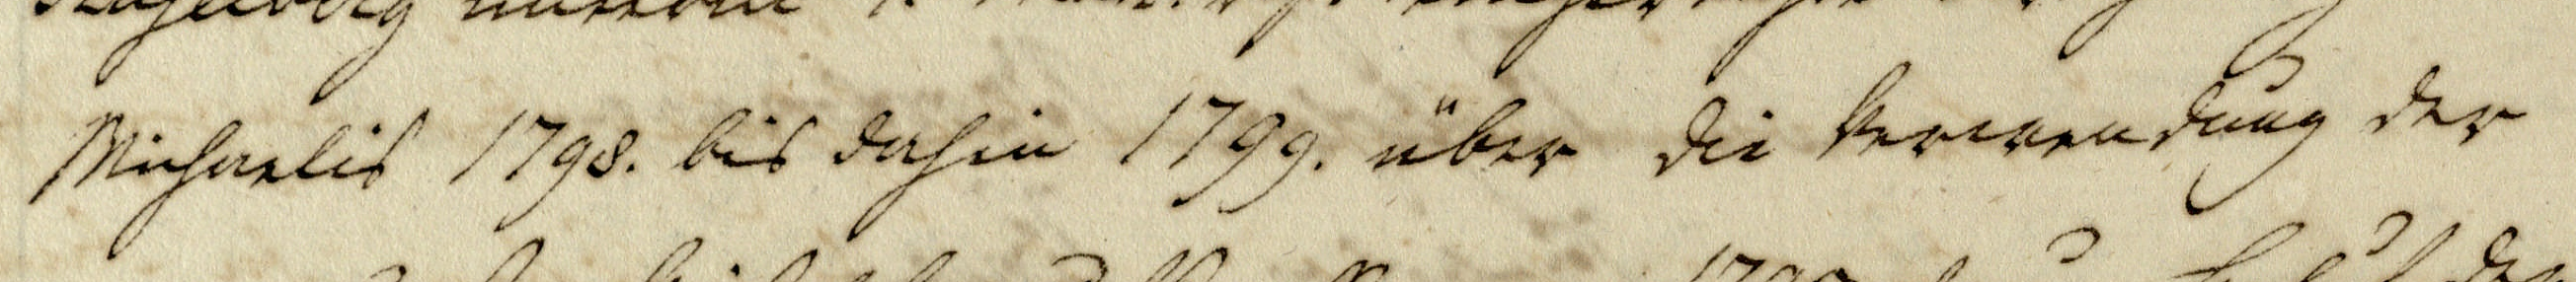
Michaelis 1798. bis dahin 1799. über die Verwendung der
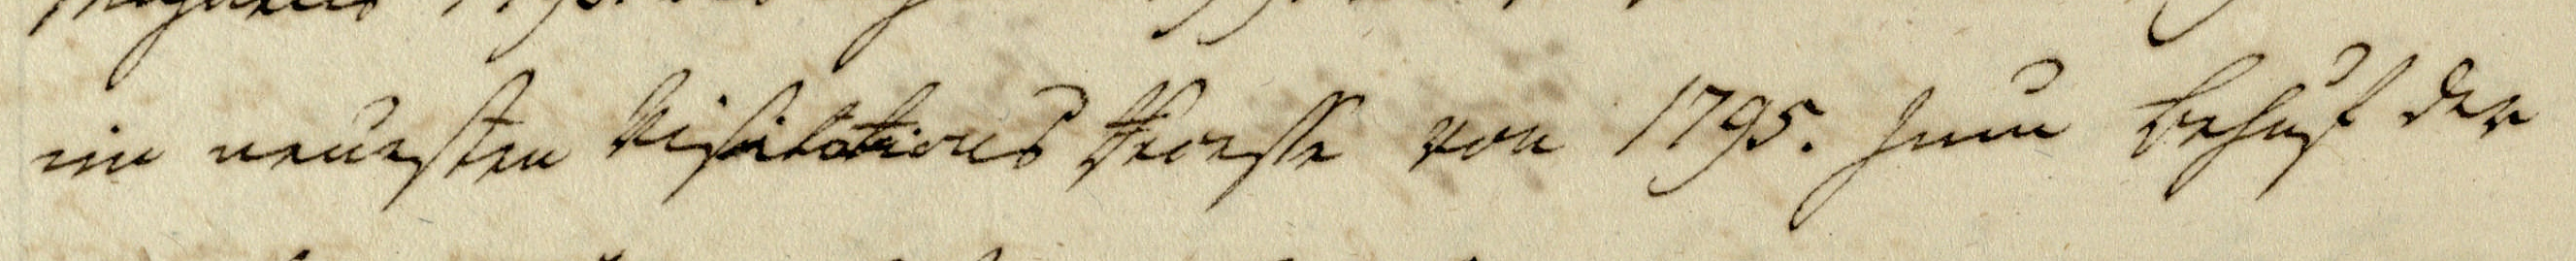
im neuesten Visitations Recesse von 1795. zum Behuf der
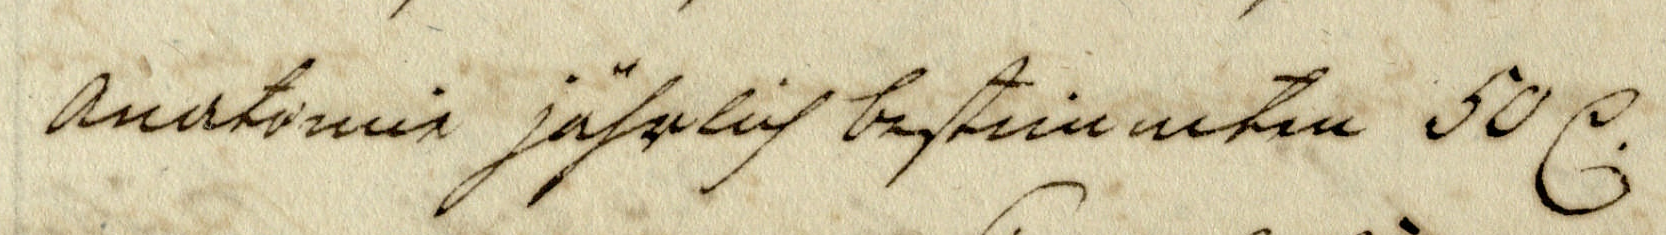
Anatomie jährlich bestimmten 50 l.
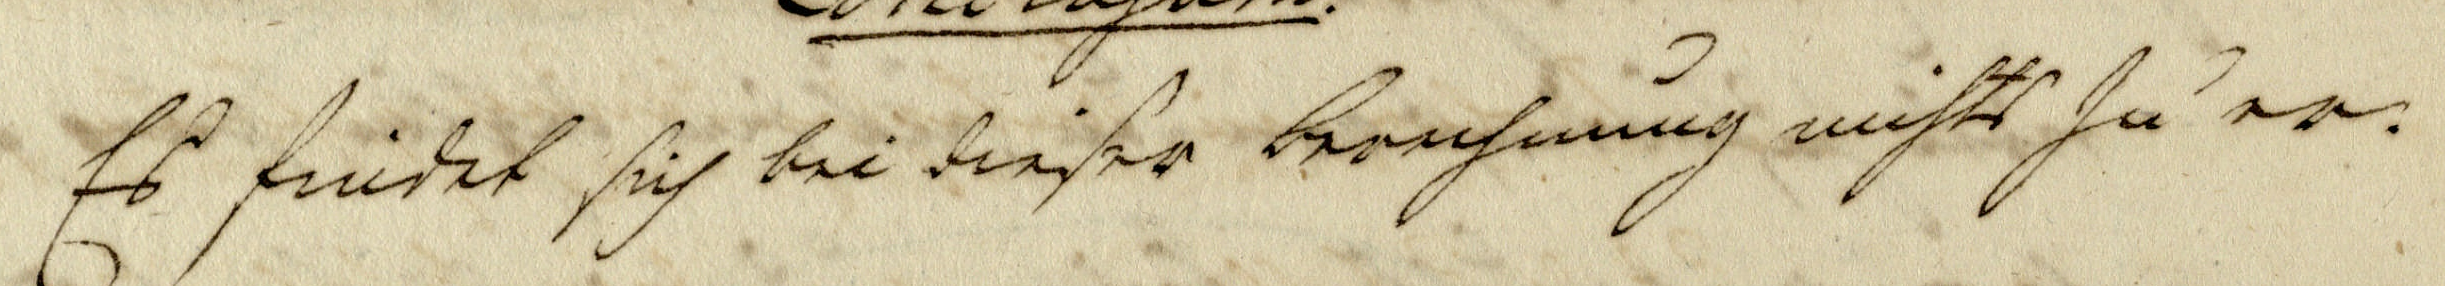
Es findet sich bei dieser Berechnung nicht zu er¬
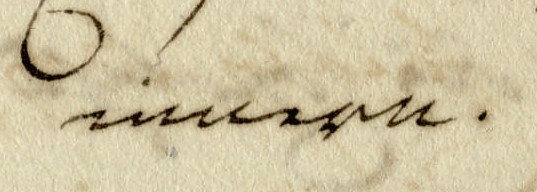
innern.
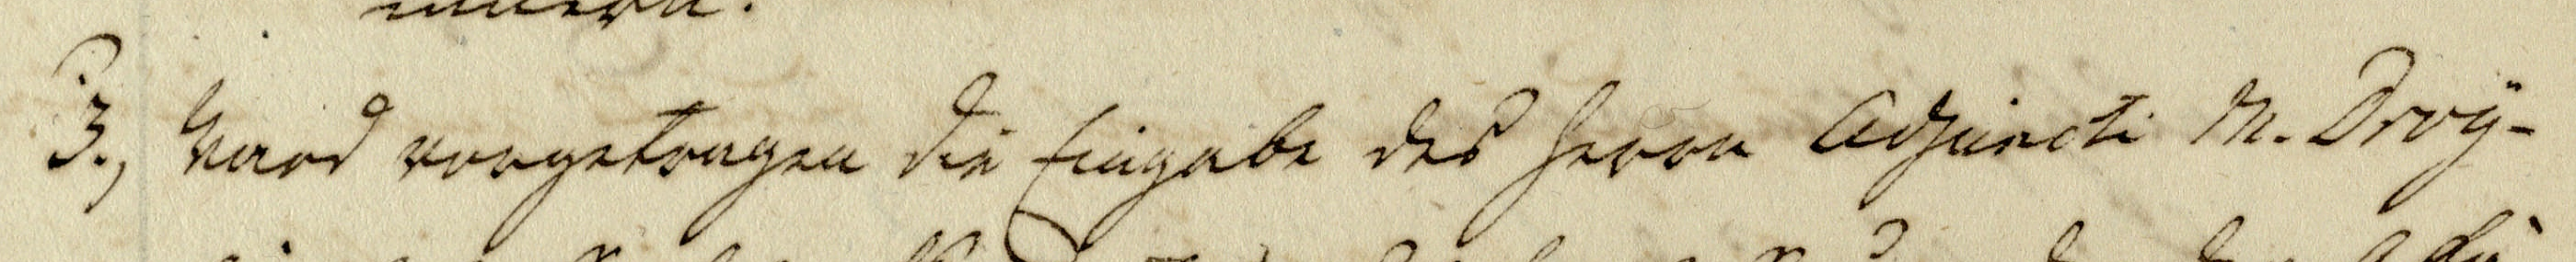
3., Wird vorgetragen die Eingabe des Herrn Adjuncti M. Droÿ¬
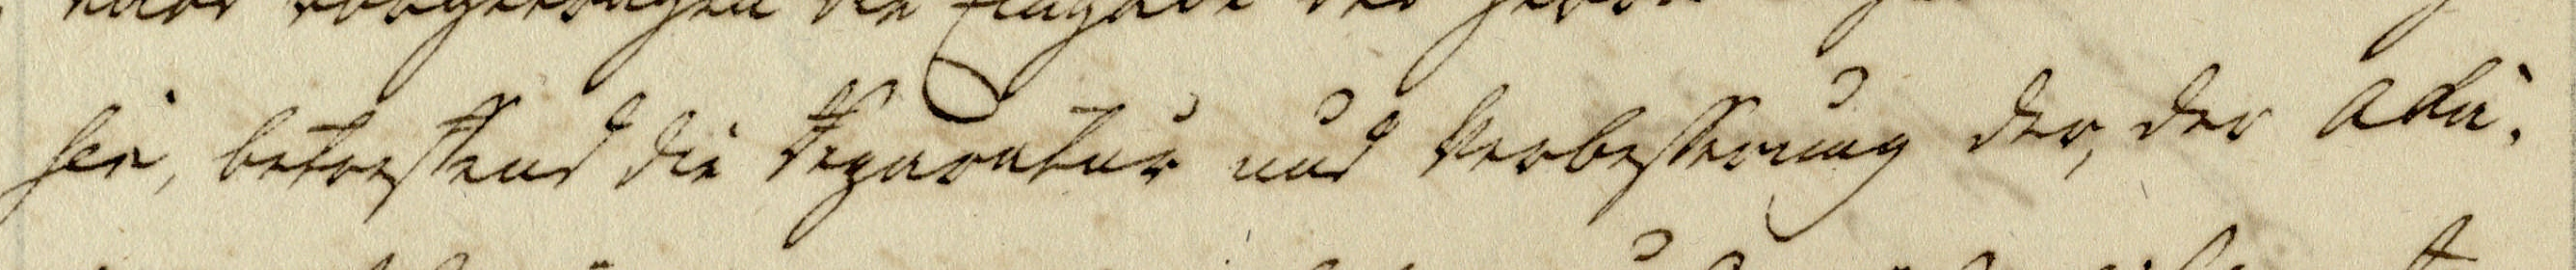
sen betreffend die Reparatur und Verbesserung der, der Aka¬
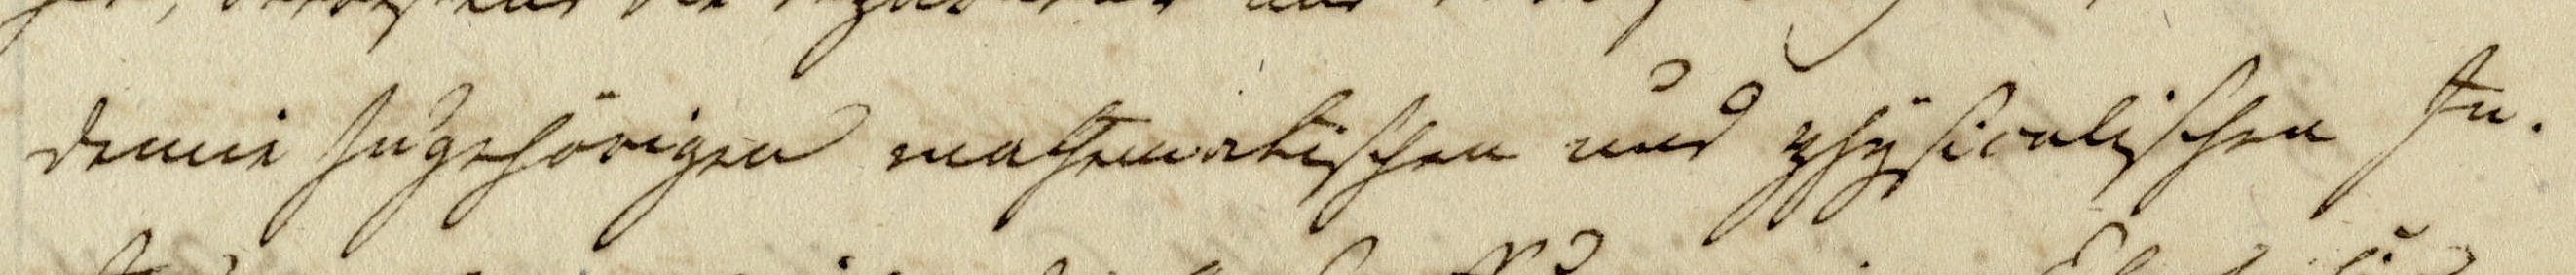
demie zugehörigen mathematischen und phÿsicalischen In¬
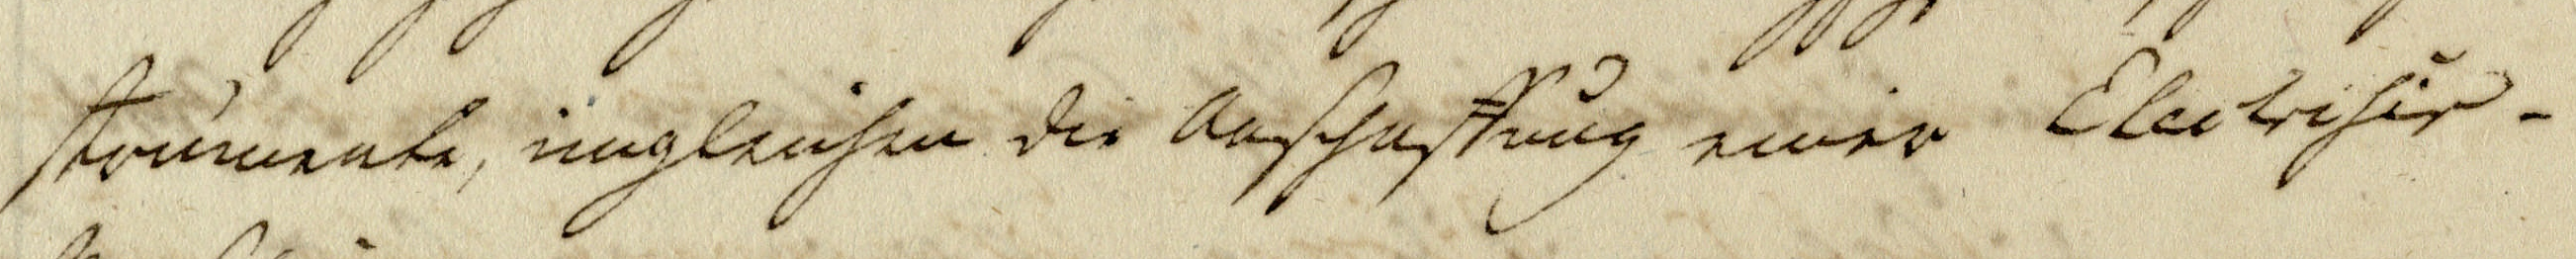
strumente, imgleichen die Anschaffung einer Electrisir-
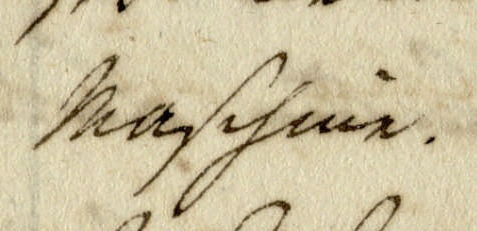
Maschine.
